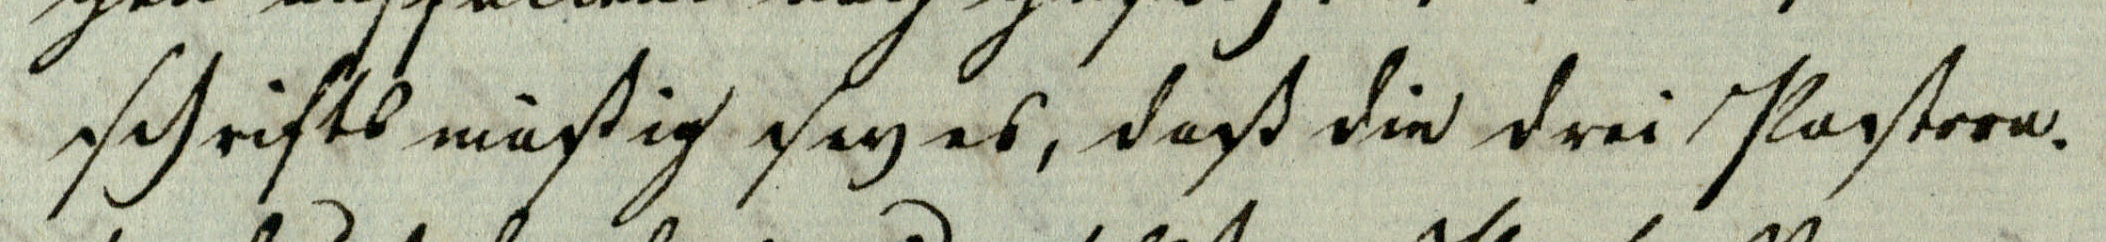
schriftsmässig sey es, daß die drei Pastora¬
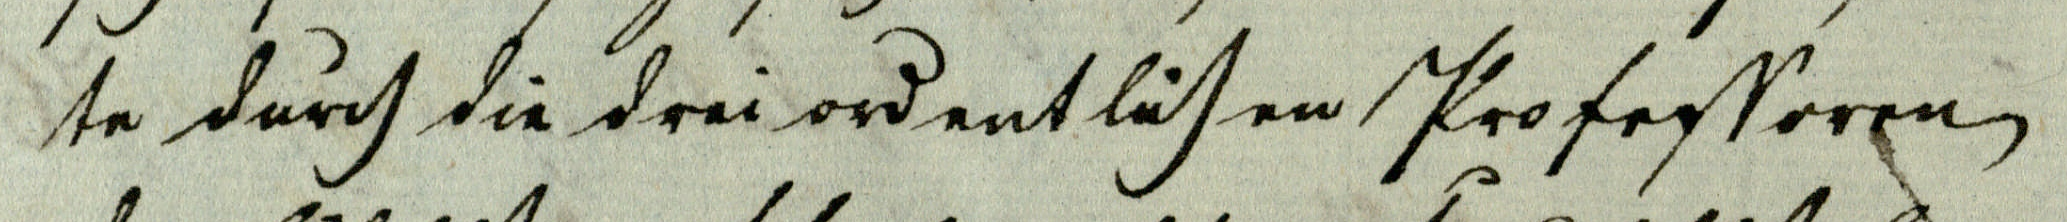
te durch die drei ordentlichen Professoren
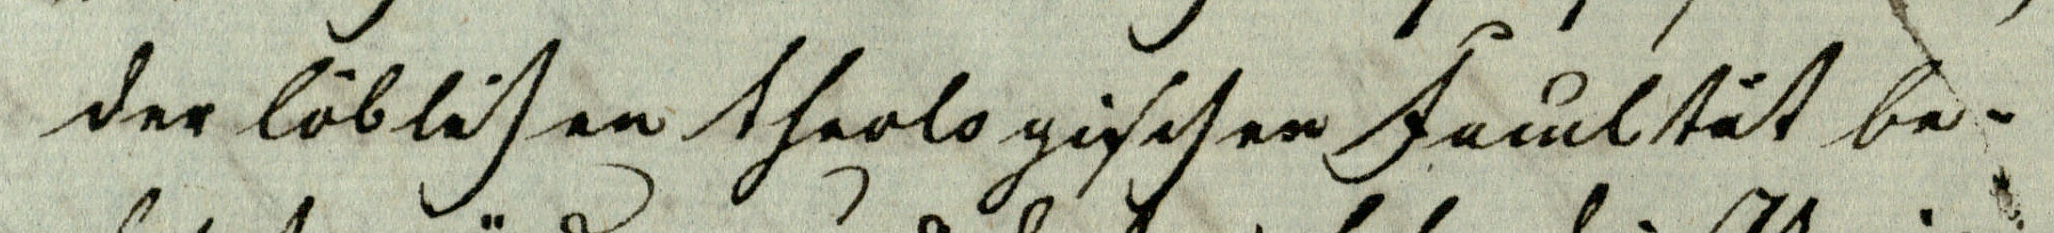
der löblichen theologischen Facultät be¬
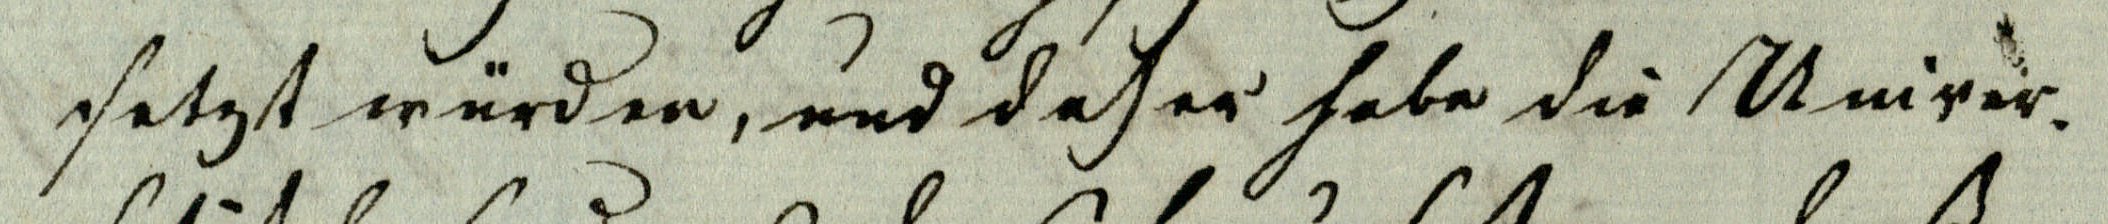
setzt würden, und daher habe die Univer¬
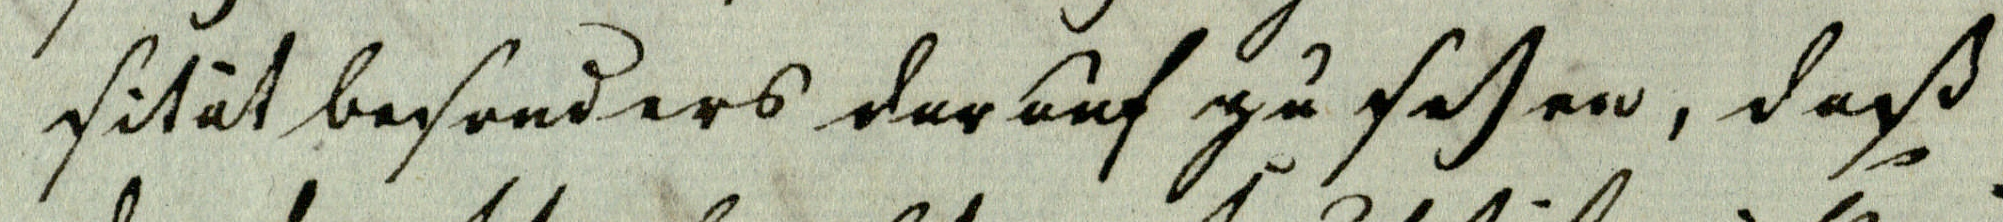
sität besonders darauf zu sehen, daß
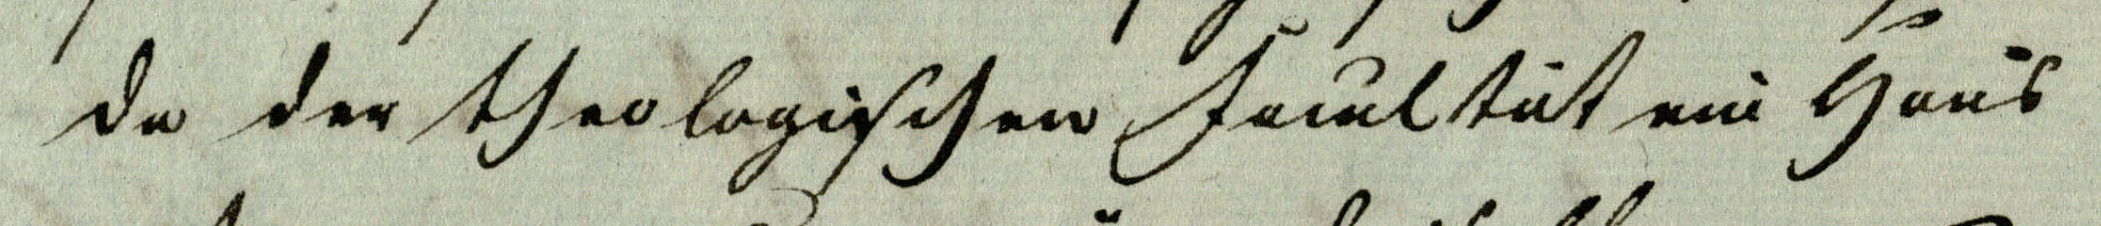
da der theologischen Facultät ein Haus
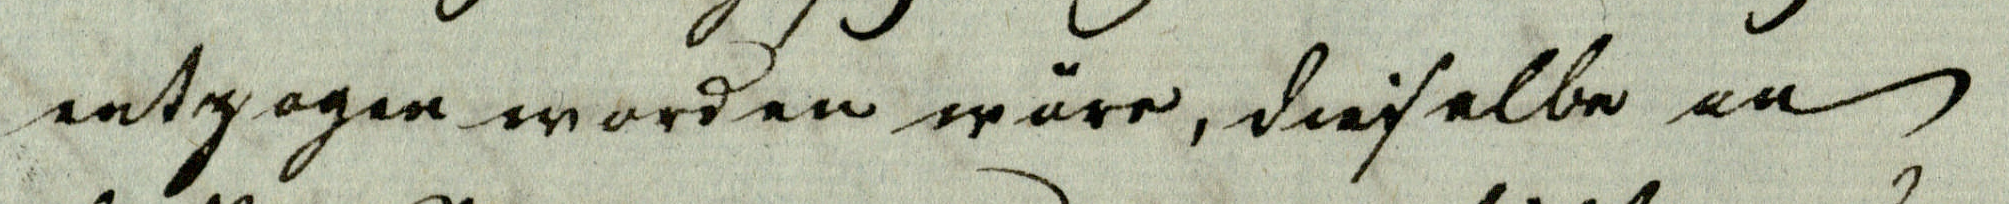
entzogen worden wäre, dieselbe an
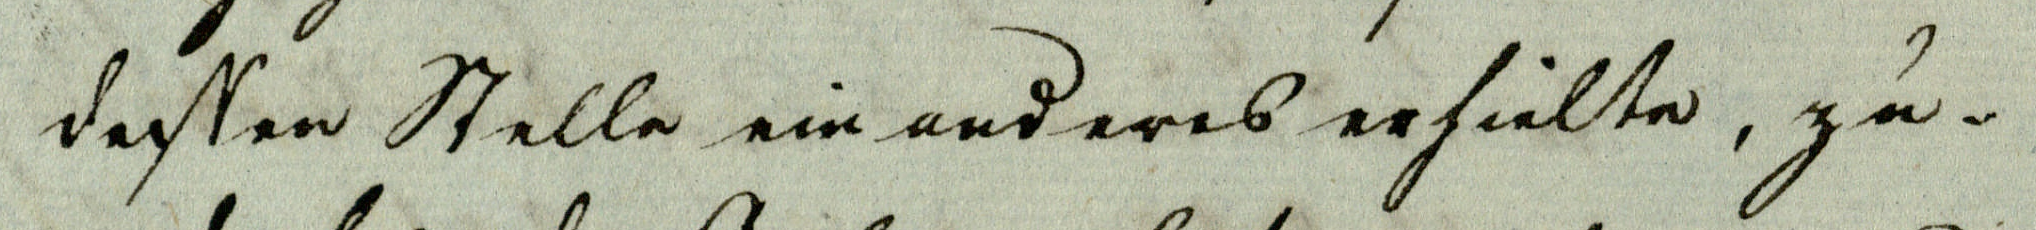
dessen Stelle ein anderes erhielte, zu¬
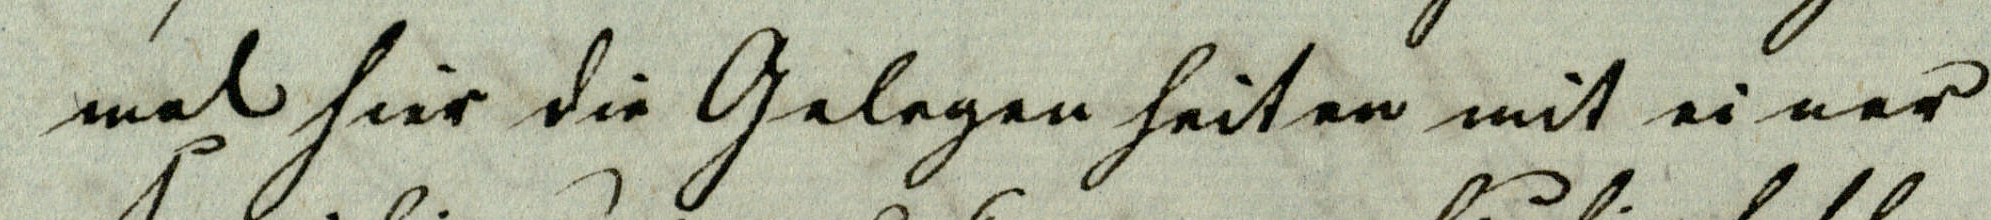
mal hier die Gelegenheiten mit einer
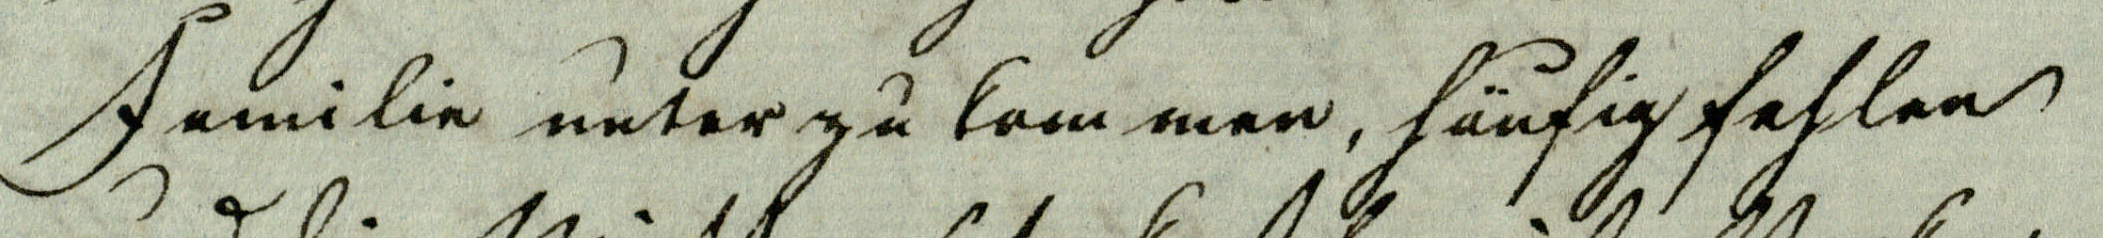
Familie unter zu kommen, häufig fehlen
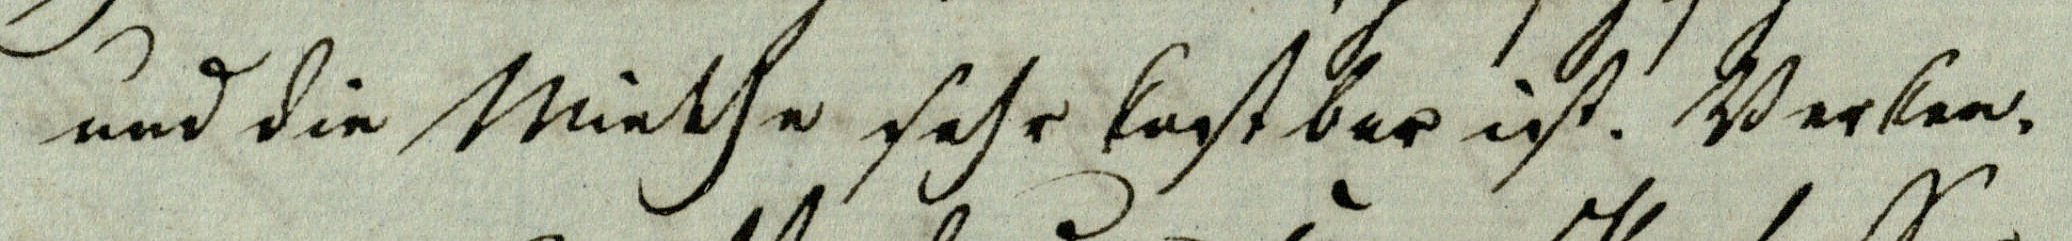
und die Miethe sehr kostbar ist. Verken¬
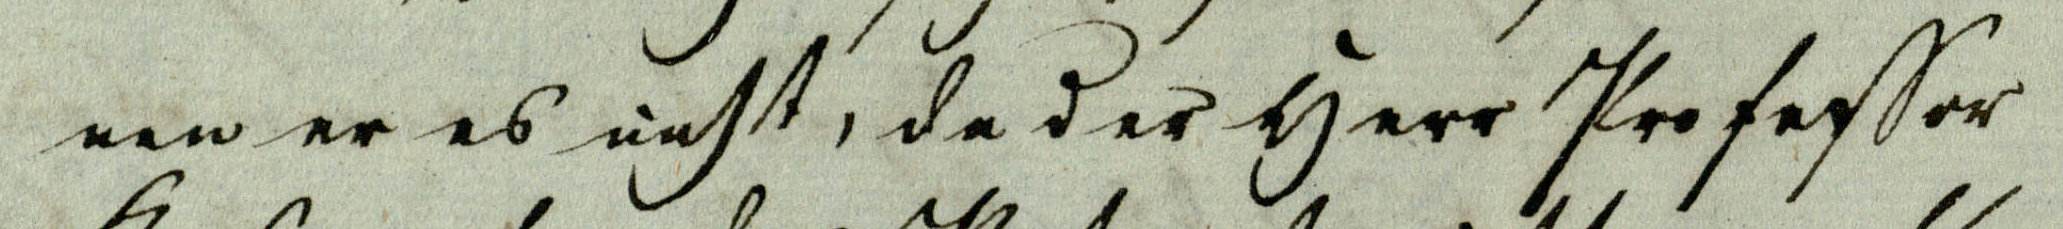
nen er es nicht, da der Herr Professor
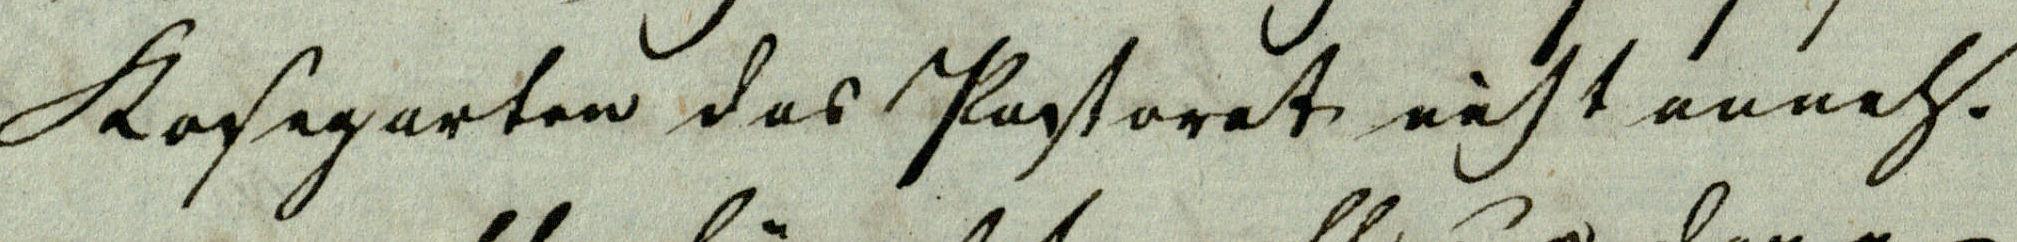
Kosegarten das Pastorat nicht anneh¬
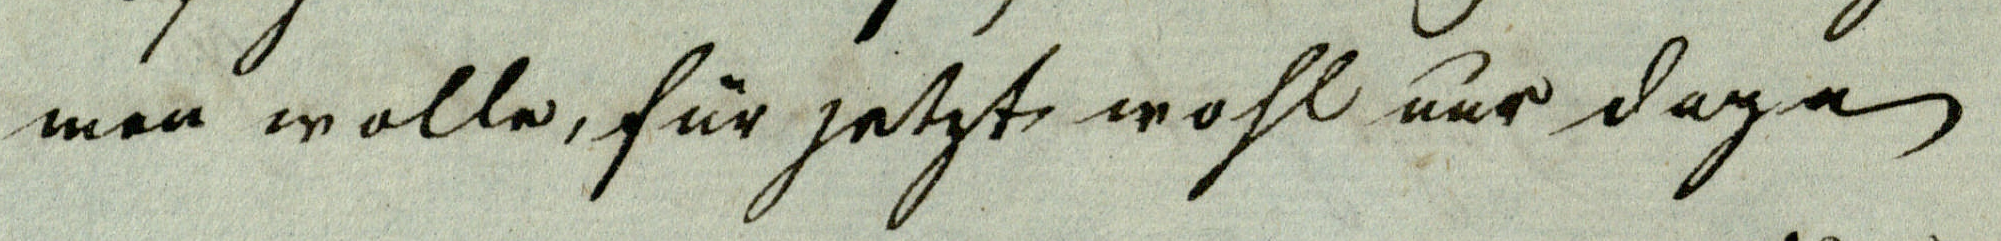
men wolle, für jetzt wohl und dazu
